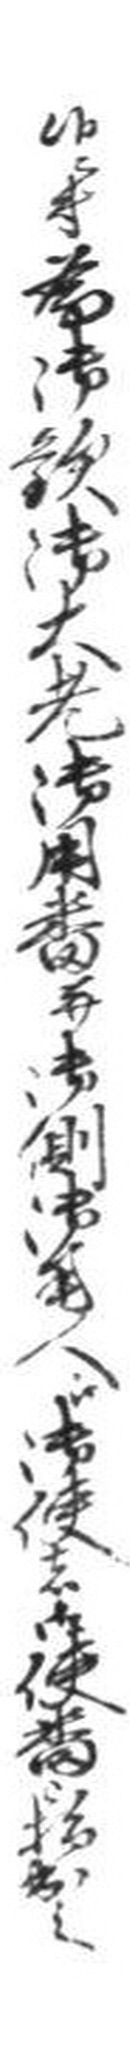候ニ付為御歓御大老御用番并御側御用人江御使者御使番被指出之
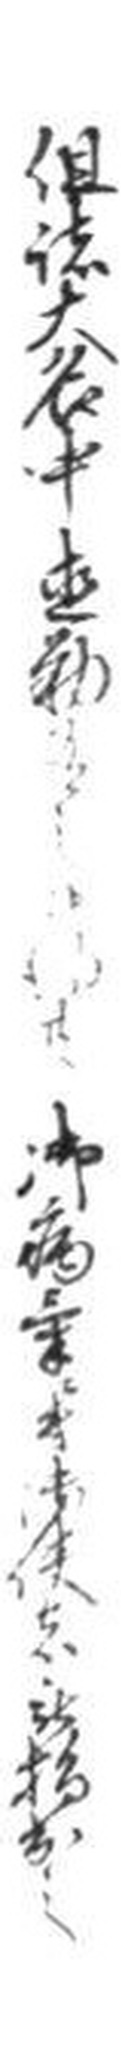但諸大名中直勤有之候得共御病気ニ付御使者被指出之
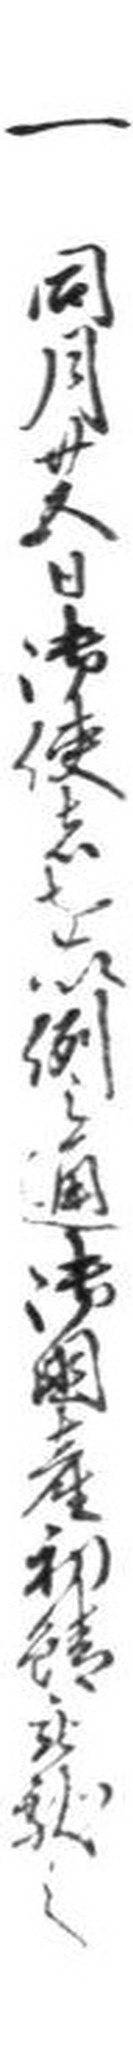一同月廿五日御使者を以例之通御国産初鯖被献之
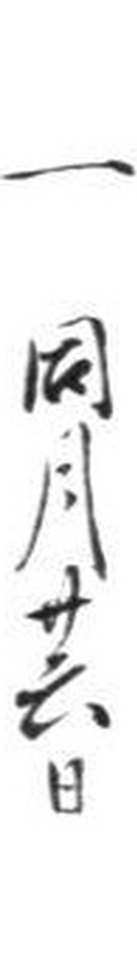一同月廿六日
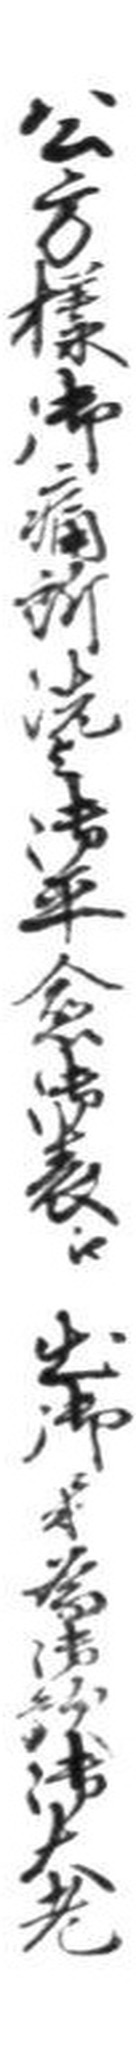公方様御痛所洗と御平愈御表江出御ニ付為御歓御大老
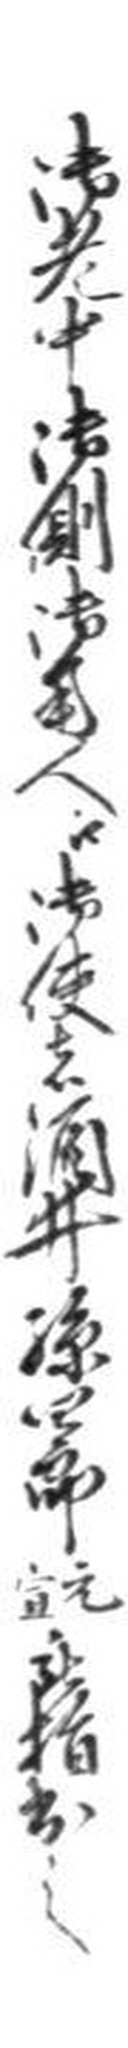御老中御側御用人江御使者酒井孫四郎元宣被指出之
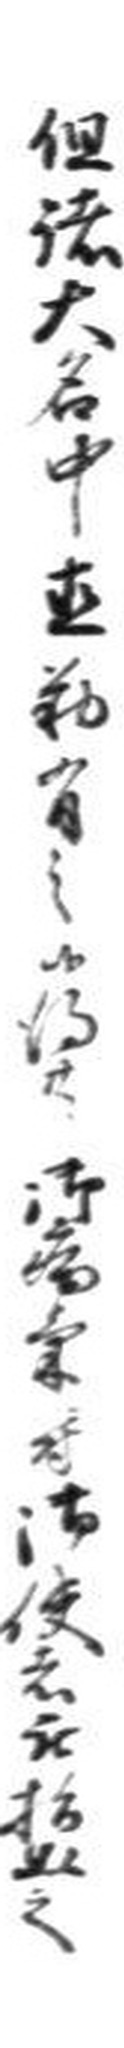但諸大名中直勤有之候得共御病気ニ付御使者被指出之
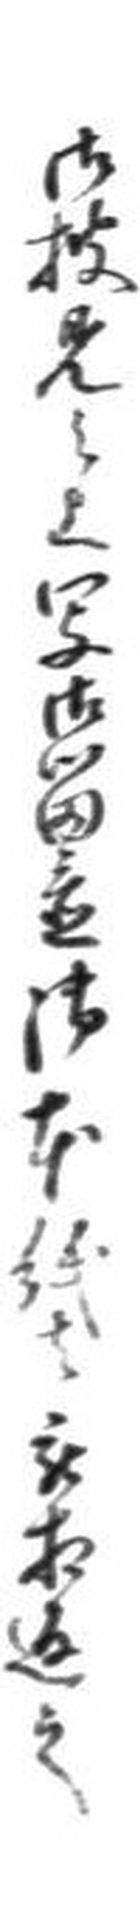御披見之上写御留置御本紙者被相返之
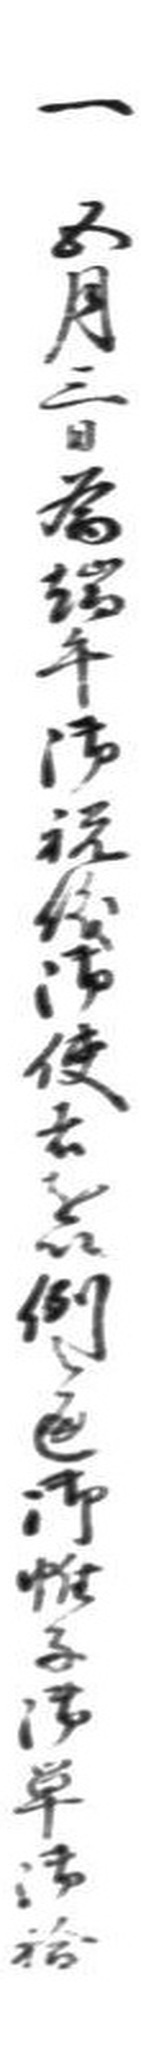一五月三日為端午御祝儀御使者を以例之通御帷子御単御袷
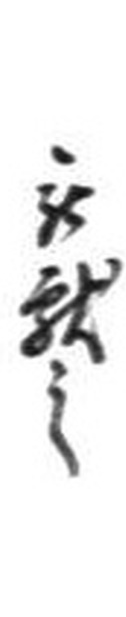被献之
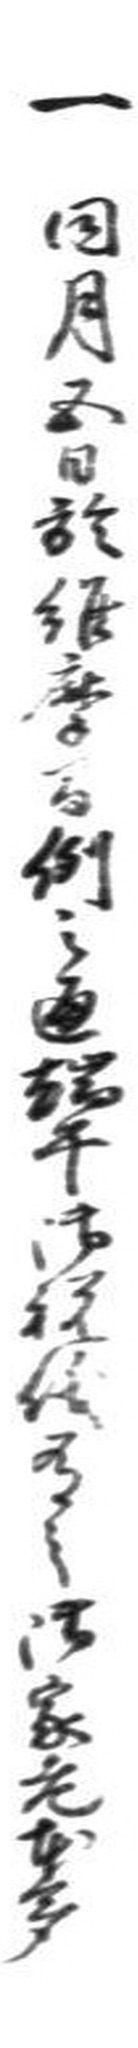一同月五日於維摩間例之通端午御祝儀有之御家老本多

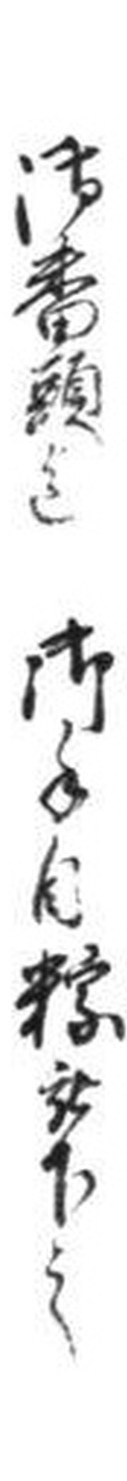御番頭迄御手自粽被下之
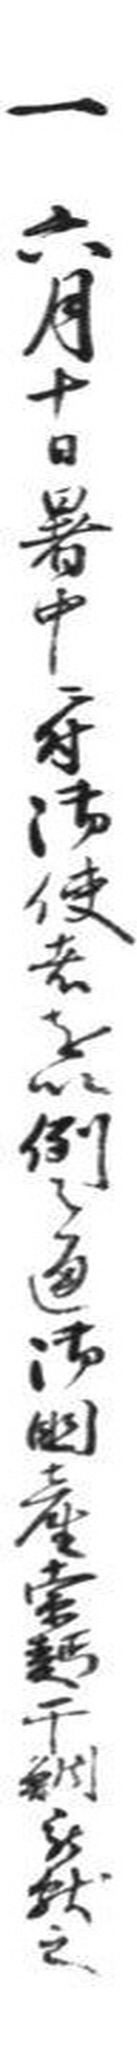一六月十日暑中ニ付御使者を以例之通御国産索麪干鯛被献之
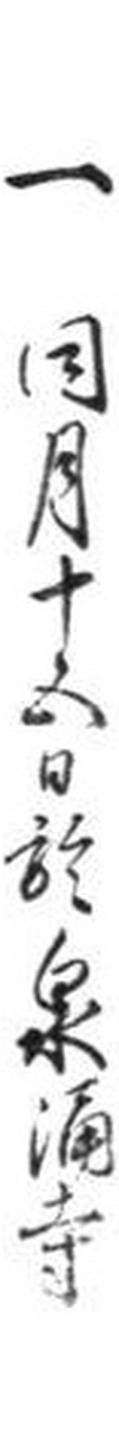一同月十五日於泉涌寺
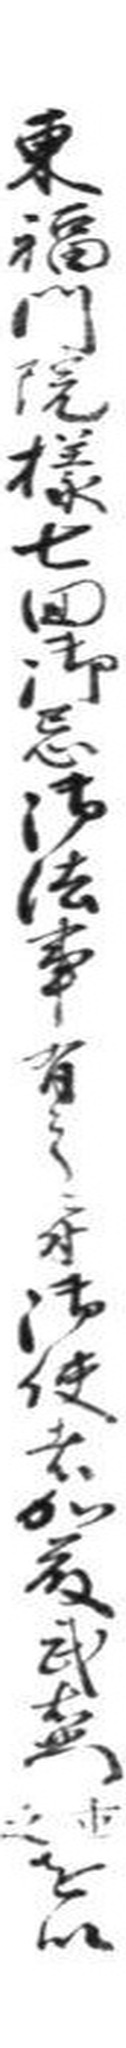東福門院様七回御忌御法事有之ニ付御使者加藤武右衛門重之を以
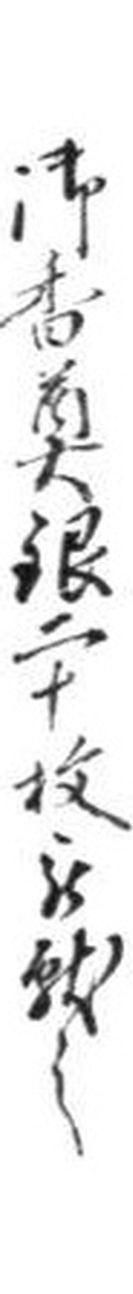御香奠銀二十枚被献之
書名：家譜 十五 綱昌公 従天和元年到元禄十二年
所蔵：福井県文書館 Fukui Prefectural Archives
